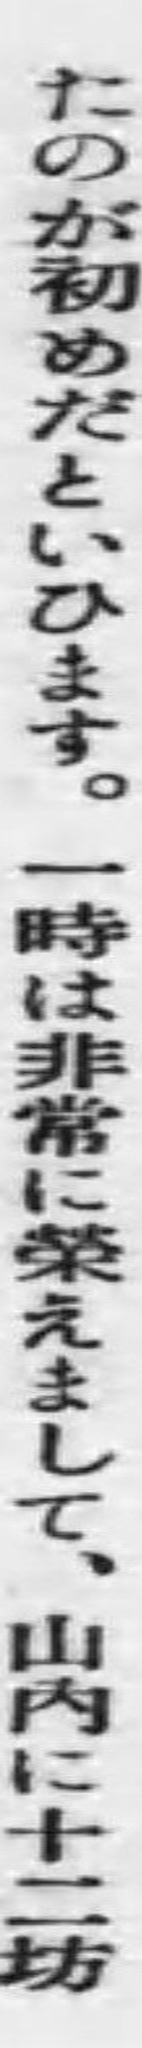たのが初めだといひます。一時は非常に栄えまして、山内に十二坊
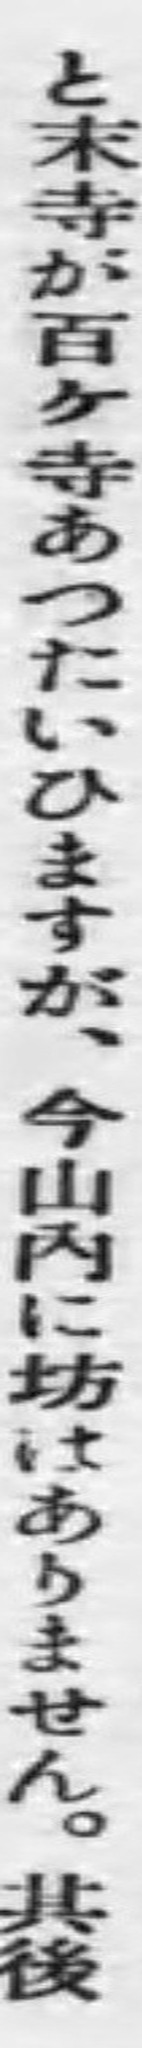と末寺が百ヶ寺あつたいひますが、今山内に坊はありません。其後
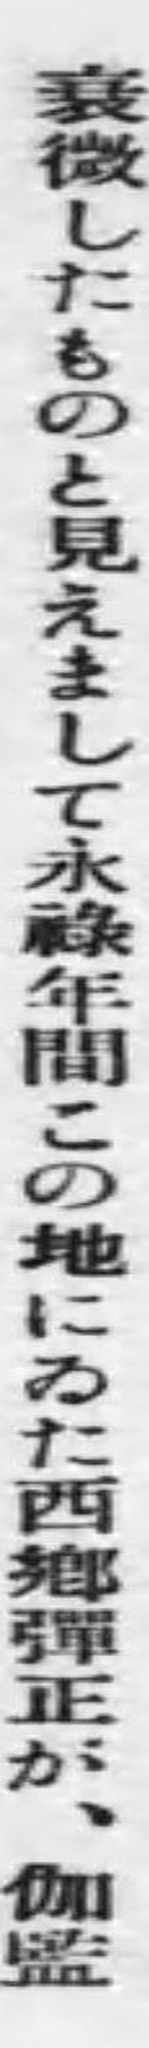衰微したものと見えまして永禄年間この地にゐた西郷弾正が、伽監
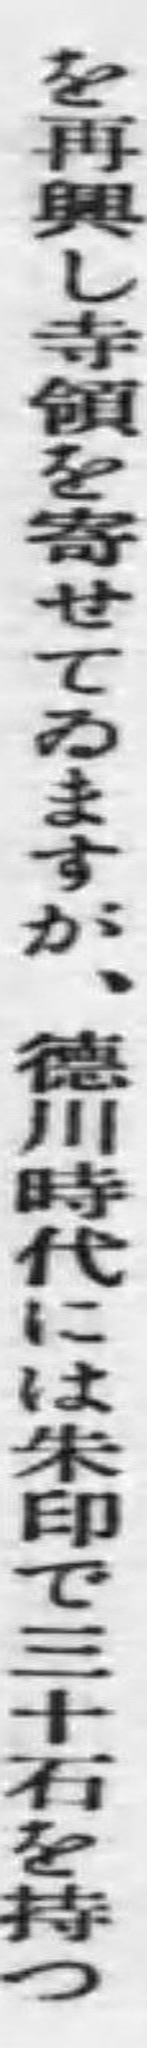を再興し寺領を寄せてゐますが、徳川時代には朱印で三十石を持つ
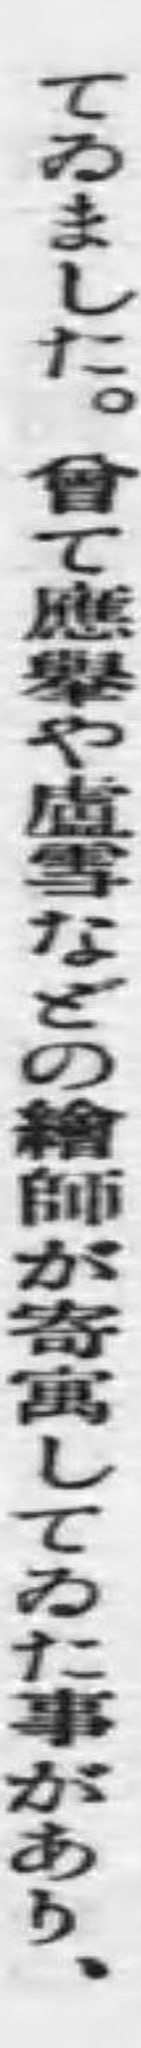てゐました。曽て応挙や盧雪などの絵師が寄寓してゐた事があり、
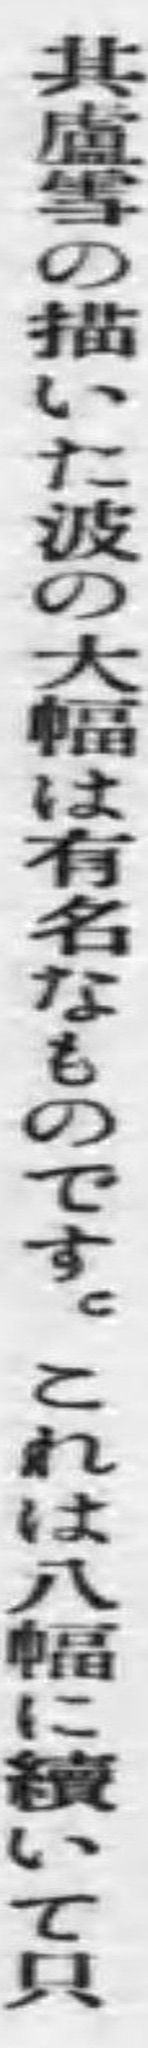其盧雪の描いた波の大幅は有名なものです。これは八幅に続いて只
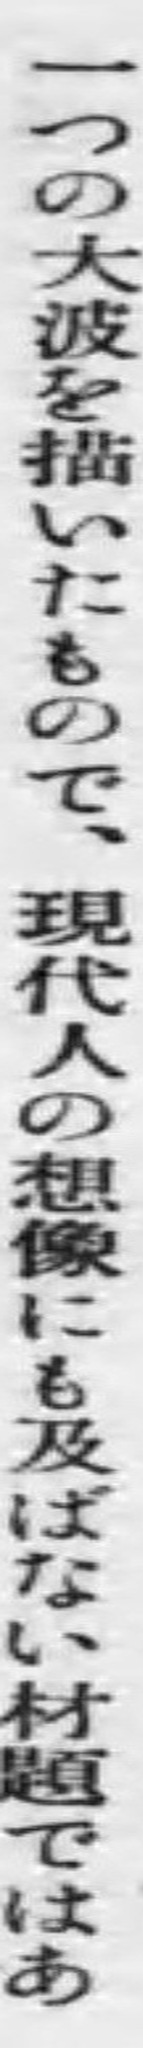一つの大波を描いたもので、現代人の想像にも及ばない材題ではあ
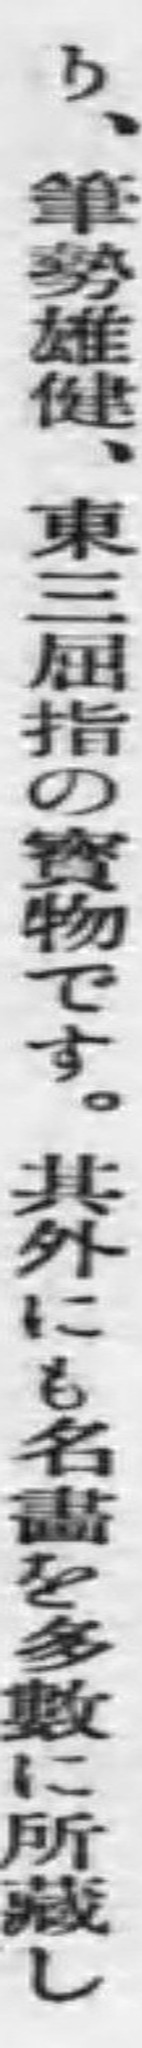り、筆勢雄健、東三屈指の宝物です。其外にも名画を多数に所蔵し
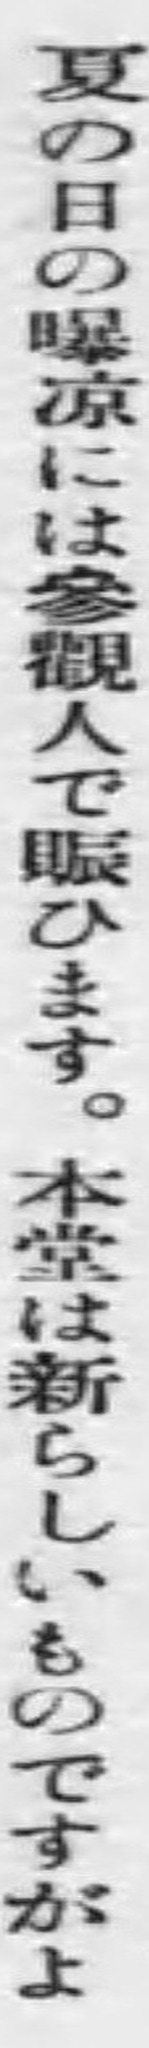夏の日の曝涼には参観人で賑ひます。本堂は新らしいものですがよ
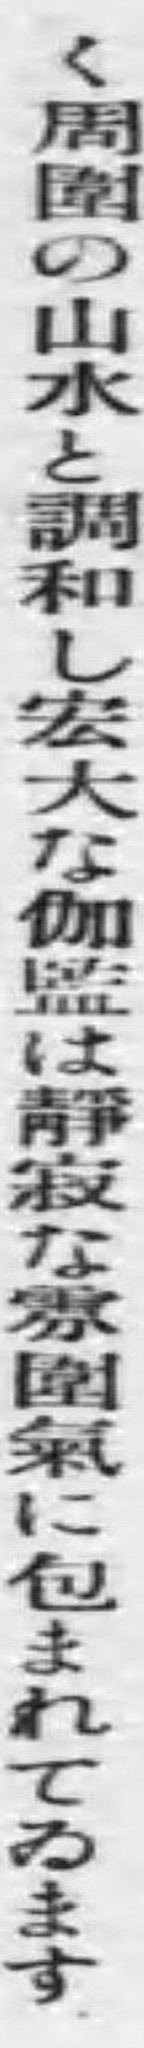く周囲の山水と調和し宏大な伽監は静寂な雰囲気に包まれてゐます
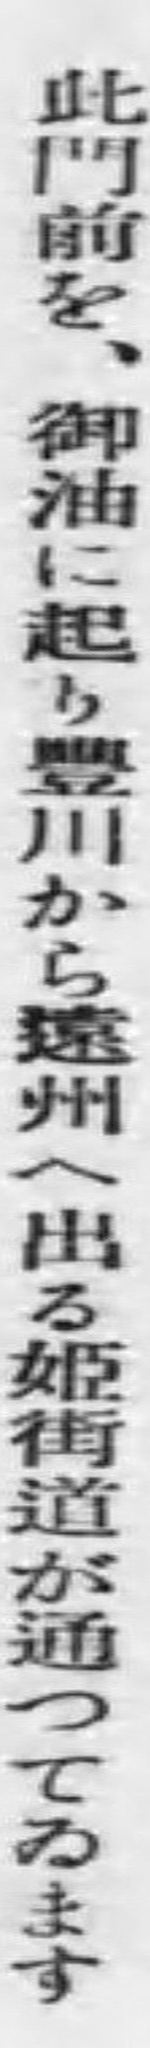此門前を、御油に起り豊川から遠州へ出る姫街道が通つてゐます
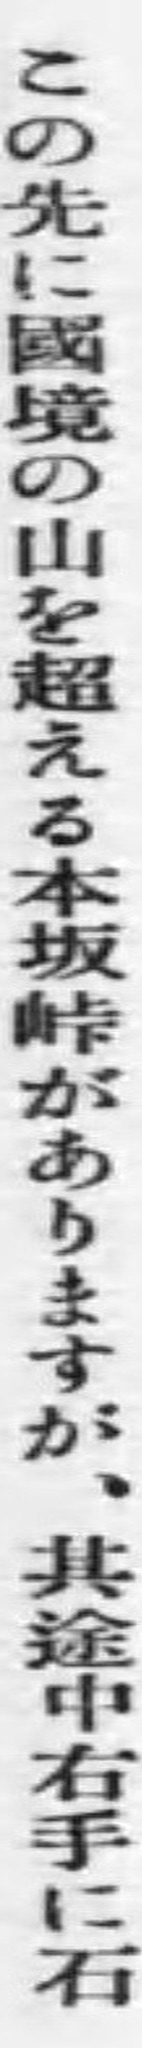この先に国境の山を超える本坂峠がありますが、其途中右手に石
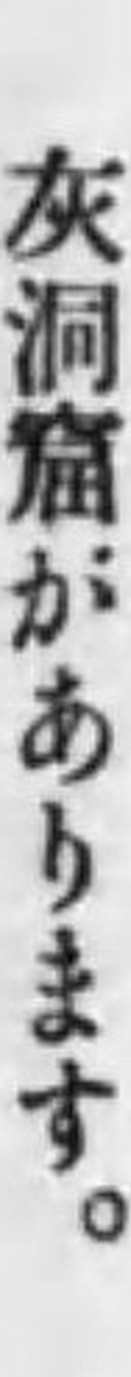灰洞窟があります。
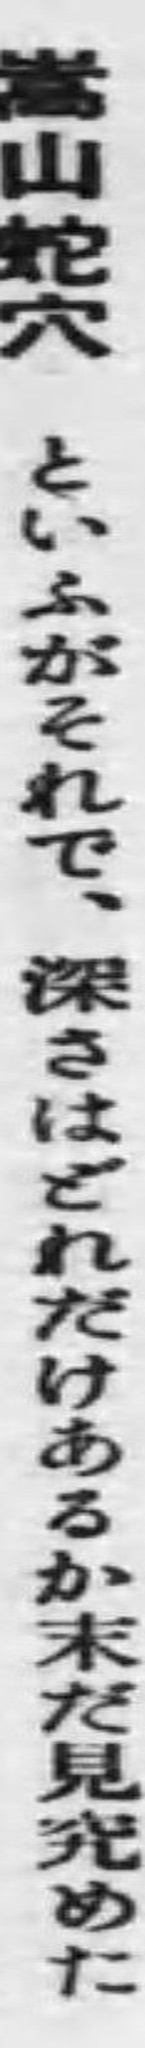嵩山蛇穴といふがそれで、深さはどれだけあるか末だ見究めた
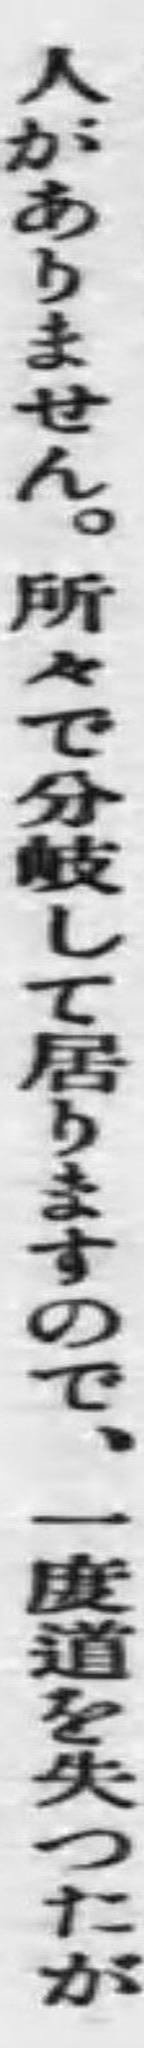人がありません。所々で分岐して居りますので、一度道を失つたが
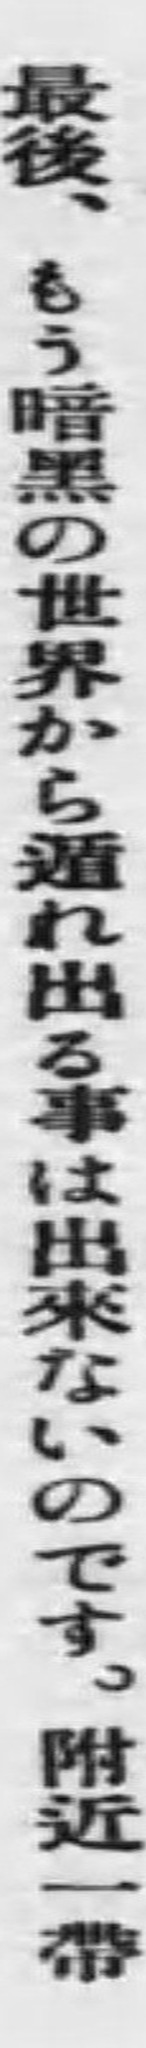最後、もう暗黒の世界から遁れ出る事は出来ないのです。附近一帯
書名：東三河道中記 : 豊橋市及其附近案内
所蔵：国立国会図書館 National Diet Library, JAPAN
